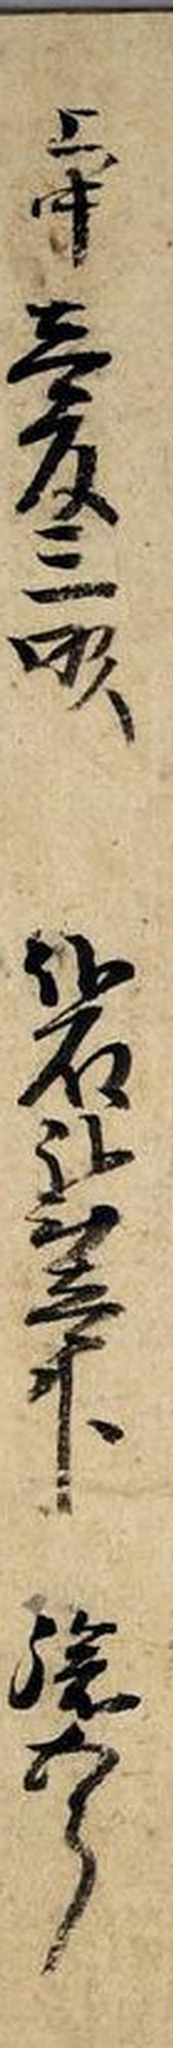上ノ中壱反三畝弐石弐斗壱升孫五郎
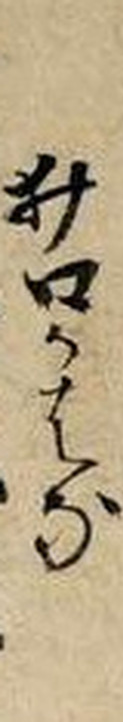井口かはな
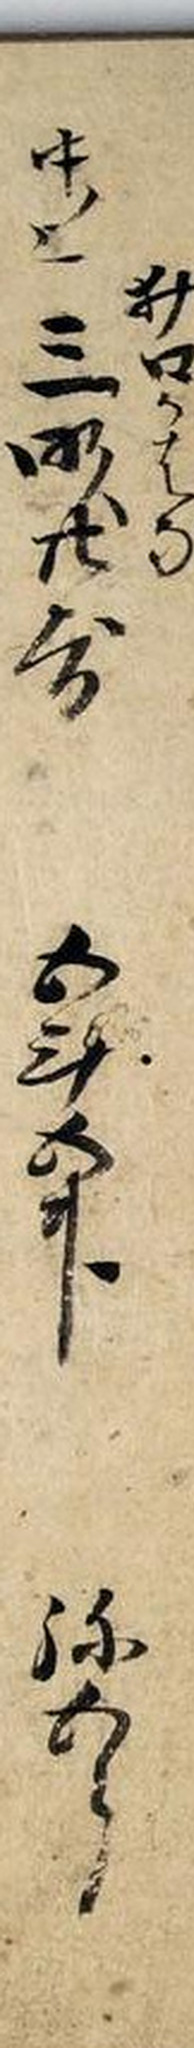中ノ上三畝廿歩五斗五升弥五郎
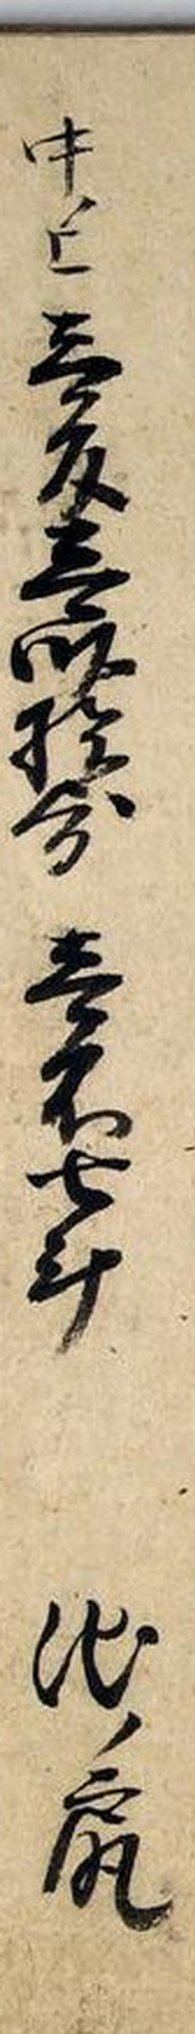中ノ上壱反壱畝拾歩壱石七斗池ノ尻
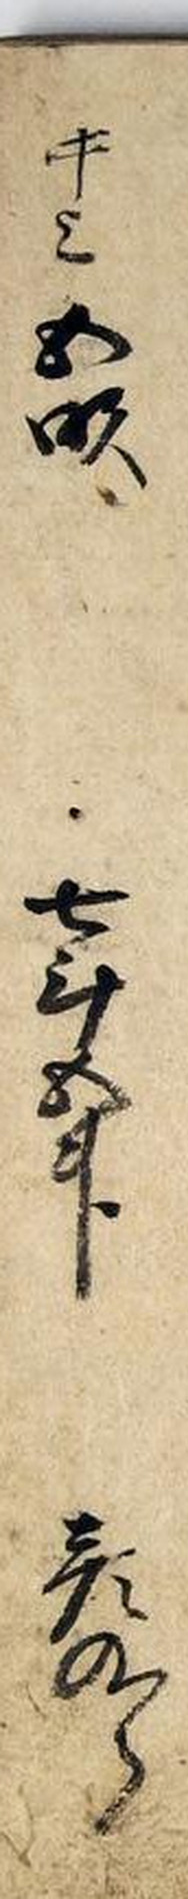中上五畝七斗五升彦九郎

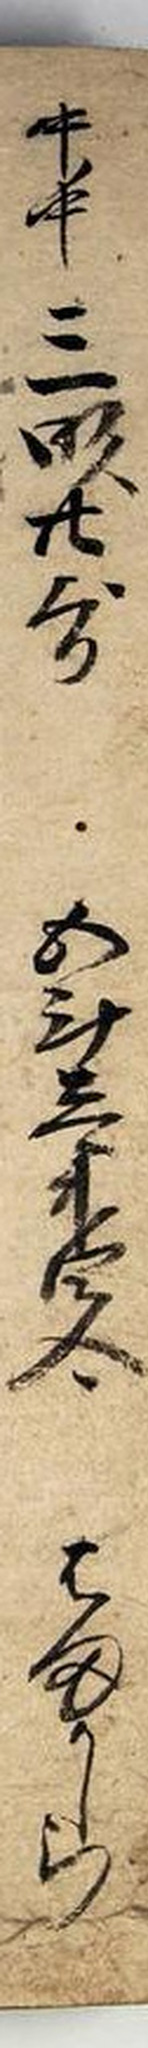中ノ中三畝廿歩五斗壱升四合はまかしら
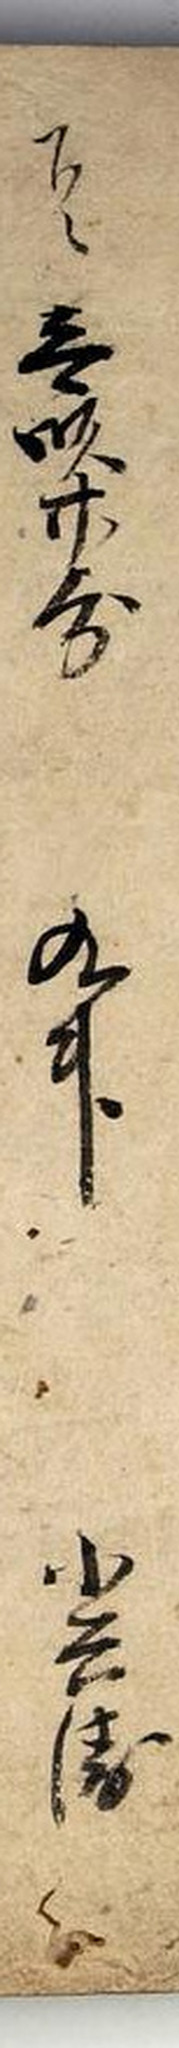下々壱畝廿歩九升小兵衛
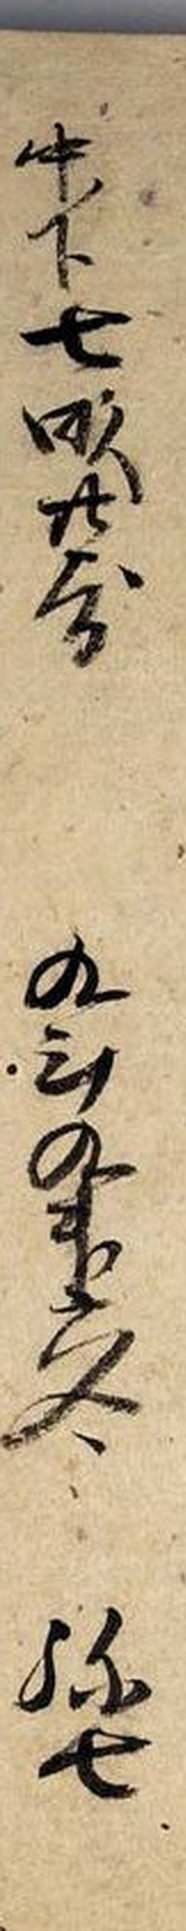中ノ下七畝廿歩九斗九升六合弥七
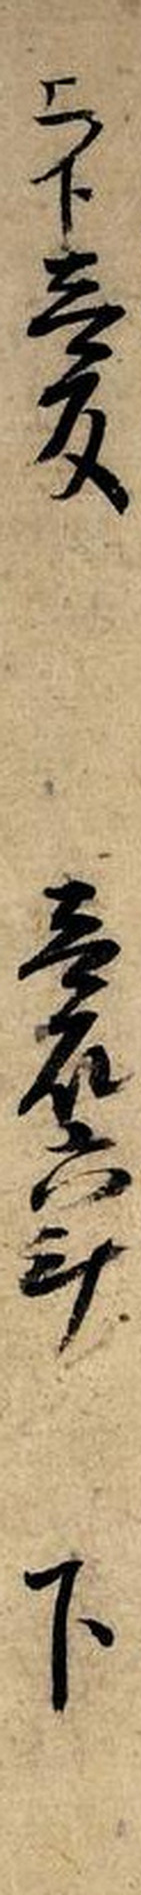上ノ下壱反壱石六斗下
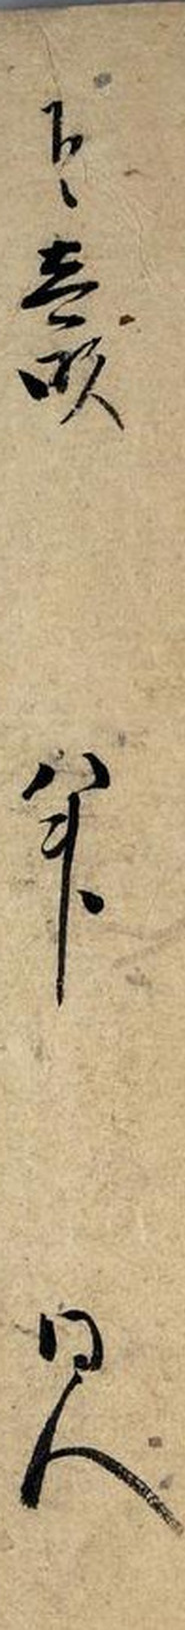下々壱畝八升同人
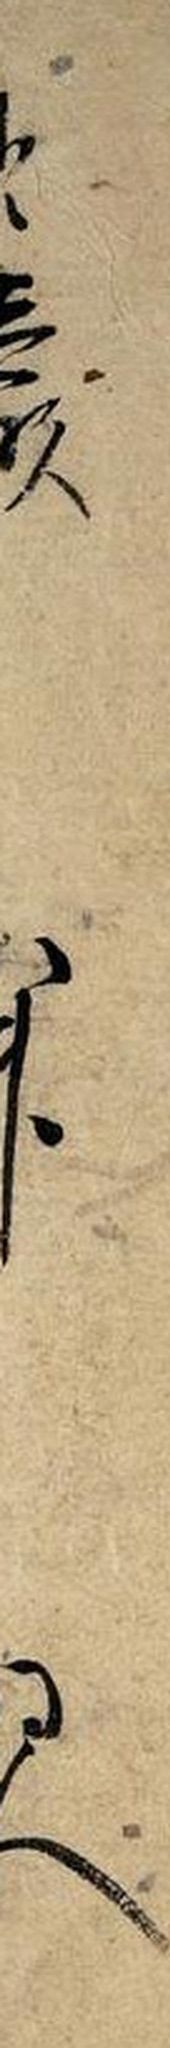下々壱畝八升同人
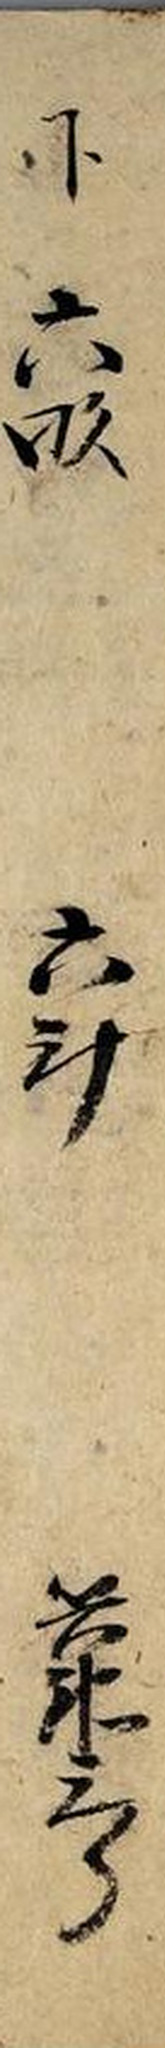下六畝六斗兵衛三郎
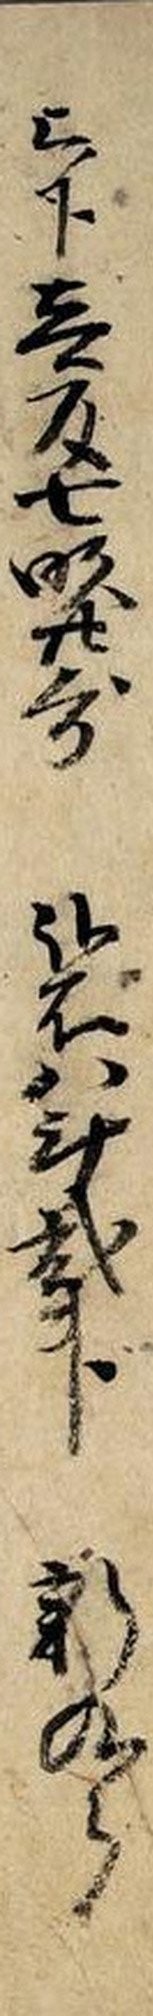上ノ下壱反七畝廿歩弐石八斗弐升新九郎
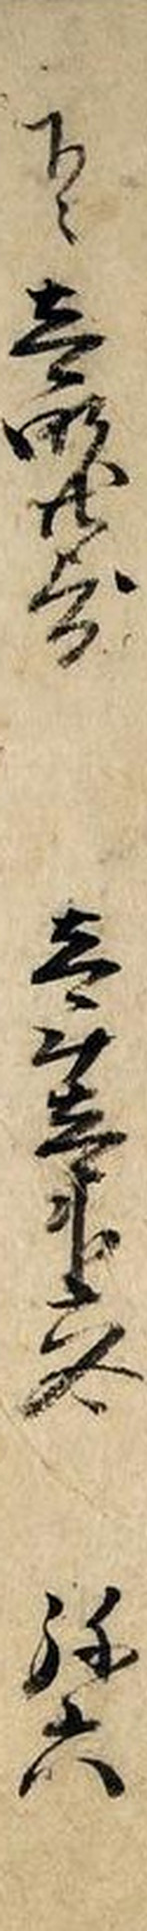下々壱畝廿歩壱斗壱升六合弥六
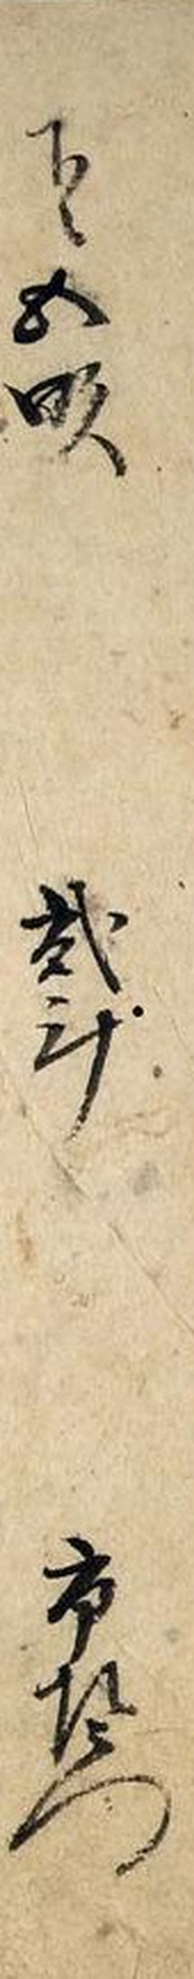下々五畝弐斗市左衛門
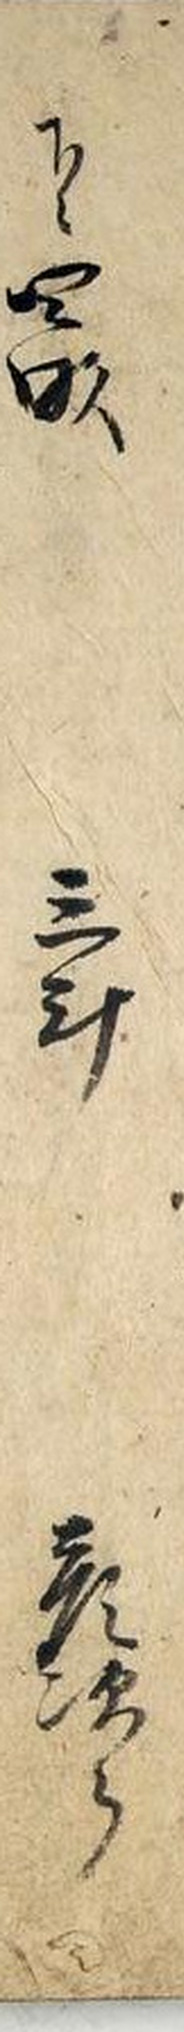下々四畝三斗彦次郎
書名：若州三方郡之内世久見浦御検地帳（世久見浦検地帳写）
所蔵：福井県文書館 Fukui Prefectural Archives
